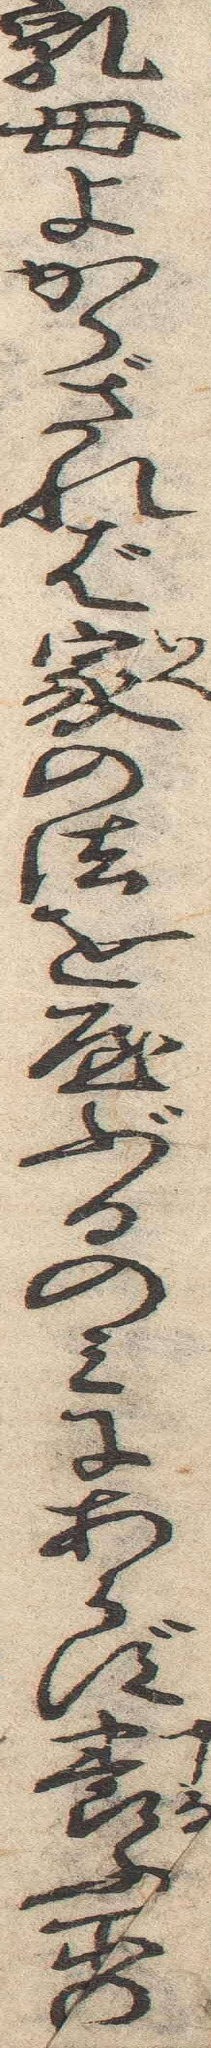乳母よからざれば家の法をやぶるのみにあらず養ふ所の
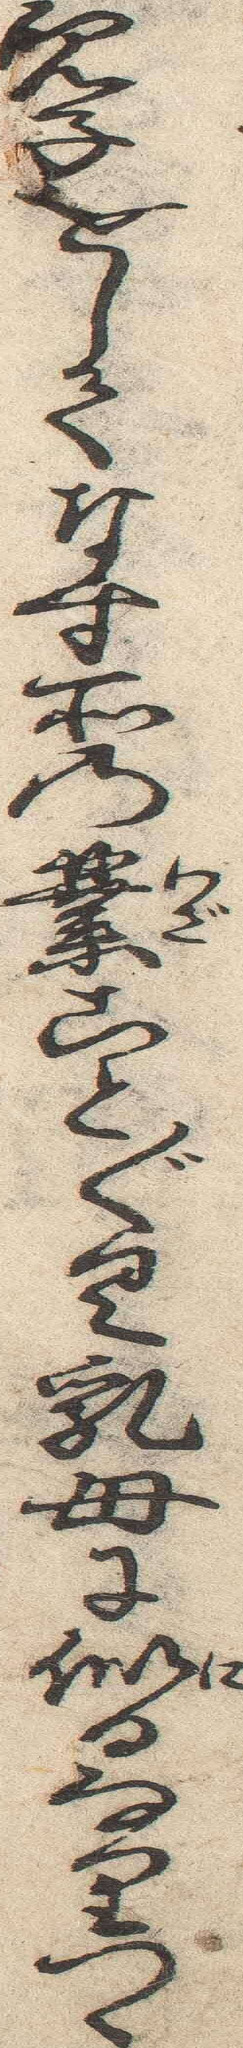児子をしてなす所の業こと〴〵く乳母に似るなりつゝ
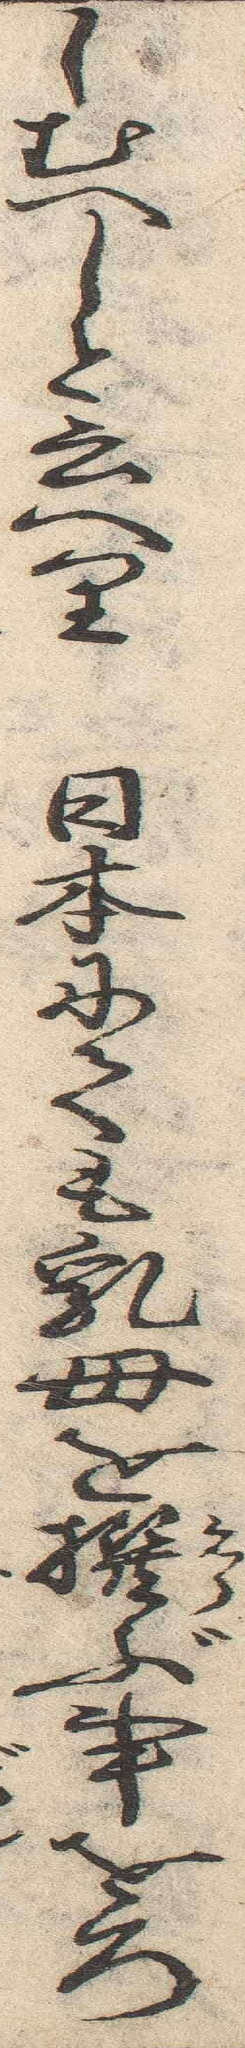しむへしと云へり日本にても乳母を撰ぶ事をろ
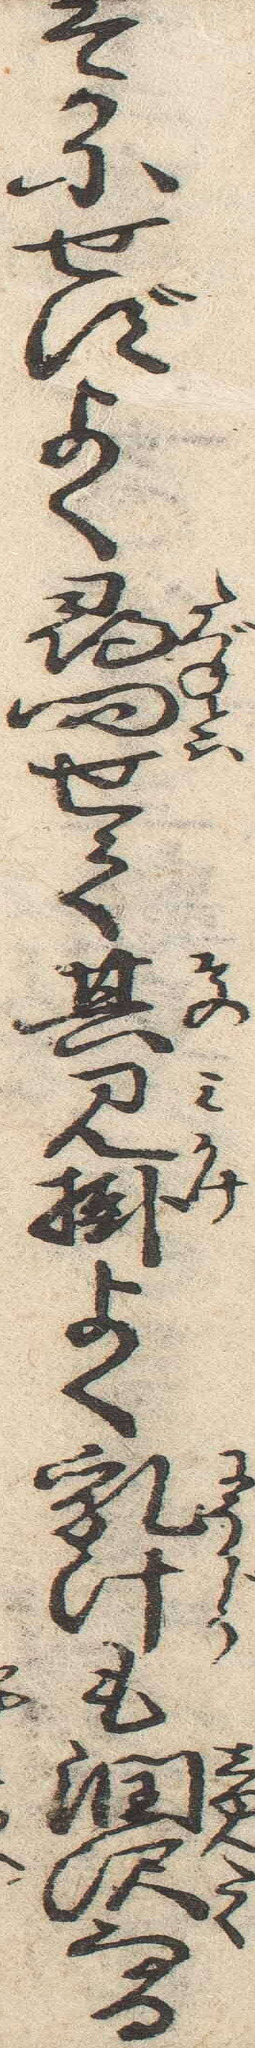そかにせずよく尋問せて其見掛よく乳汁も潤沢なる
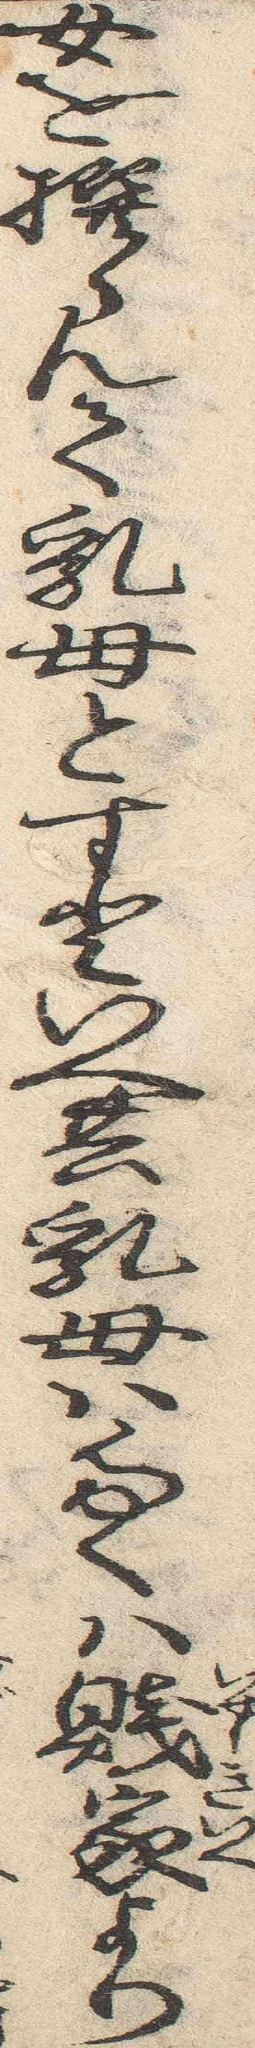女を撰みて乳母とすといへ共乳母は多くは賎家より
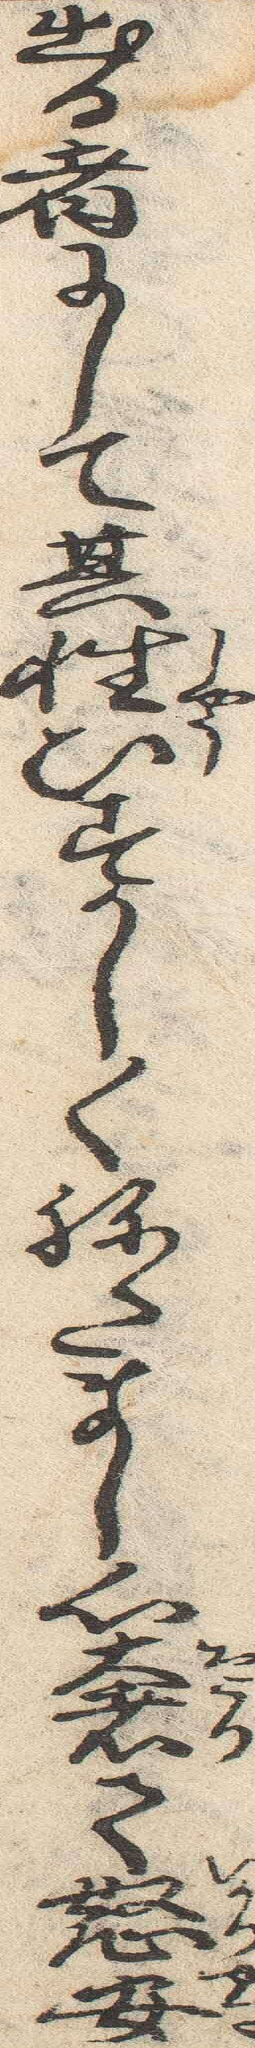出る者にして其性ひすかしくねたまし心奢て怒安
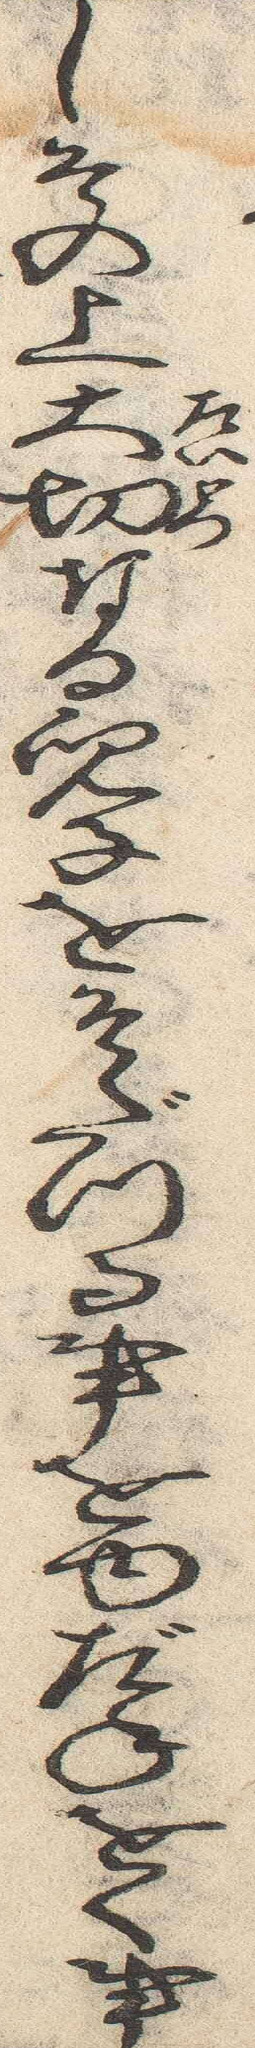しその上大切なる児子をそだつる事をゆだねをく事
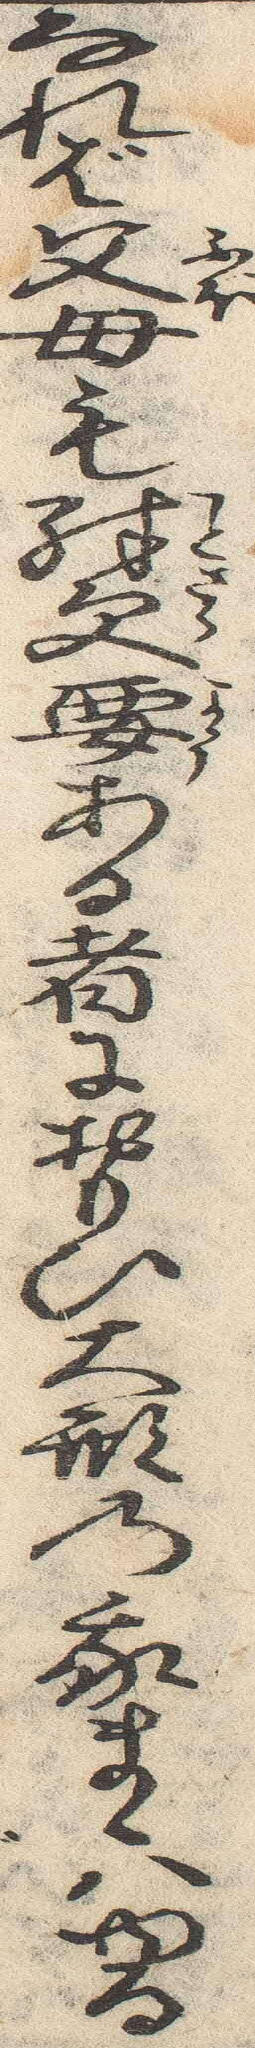なれば父母も殊更要ある者におもひ大形の我まゝはゆる
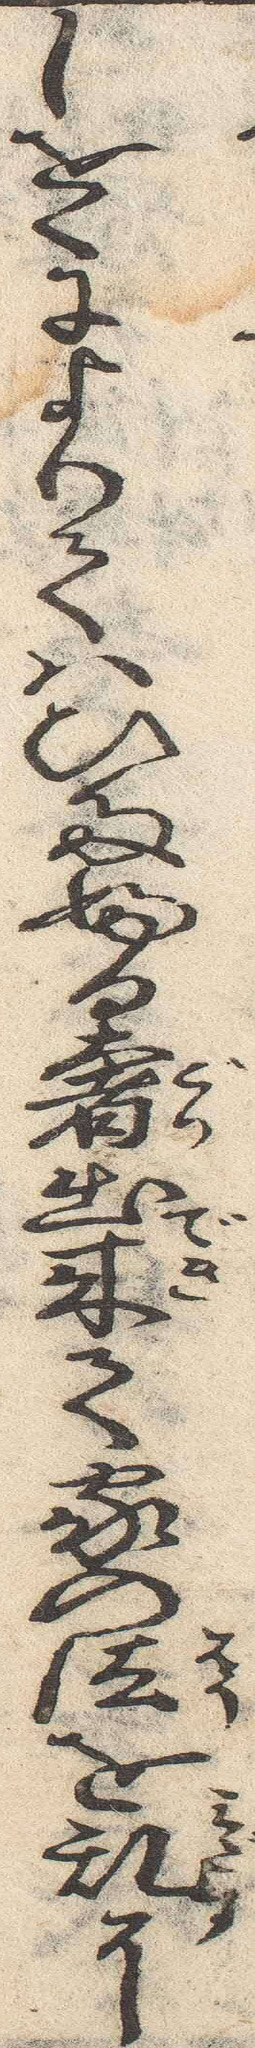しをくによりてはひたふる奢出来て家の法を乱に
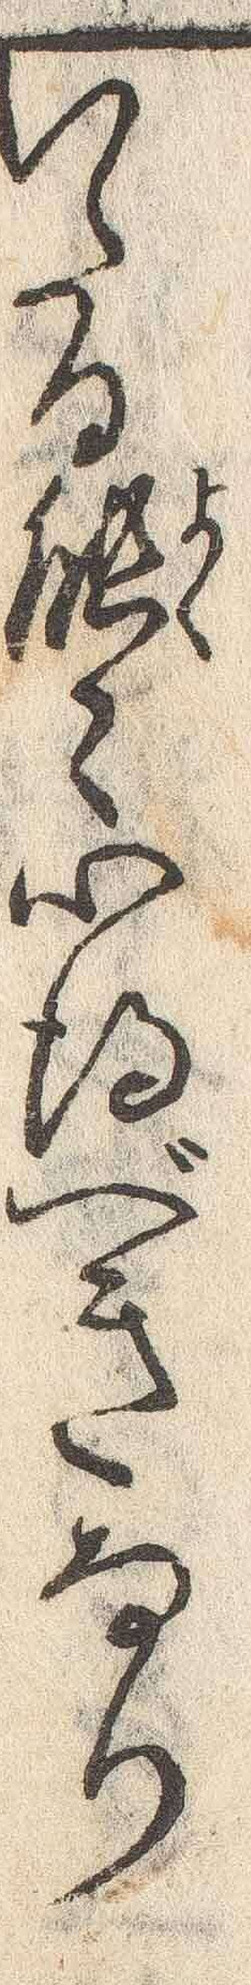いたる能々心得べきなり
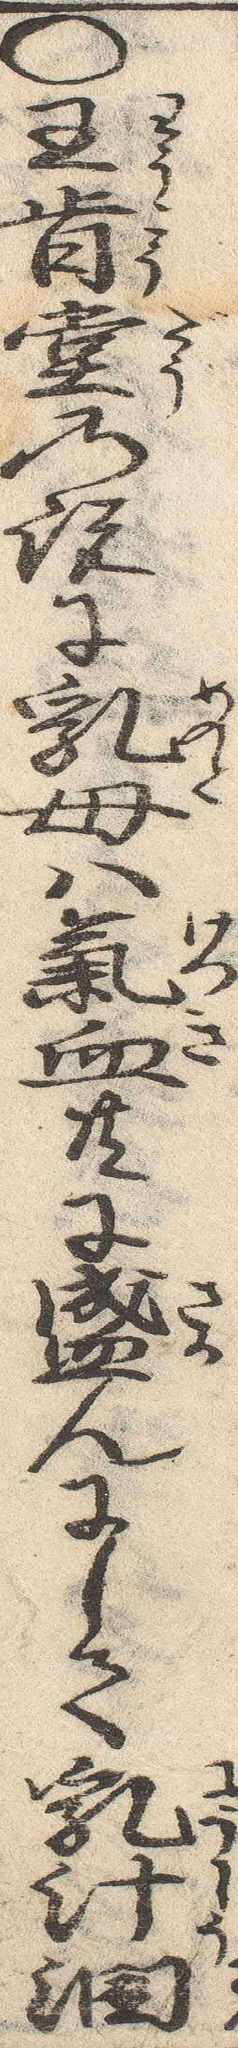◯王肯堂の説に乳母は氣血共に盛んにして乳汁潤
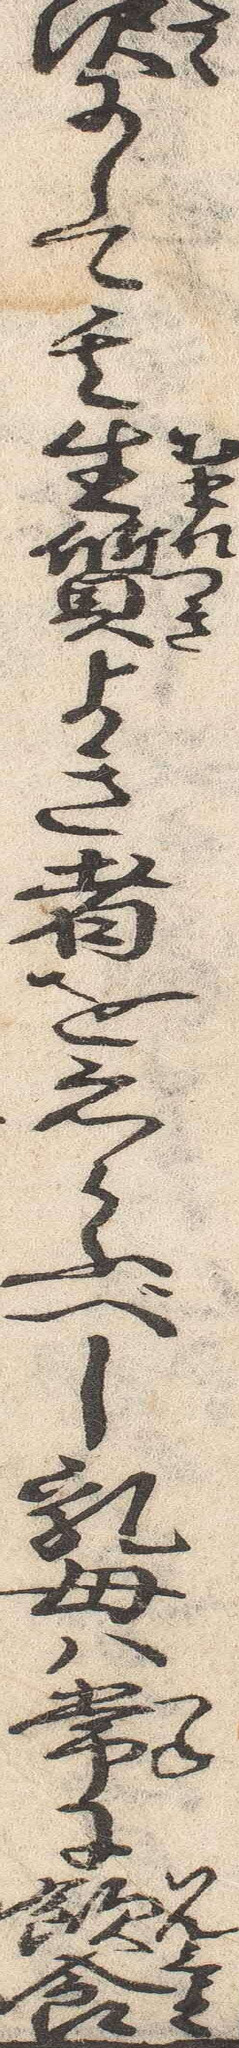沢にして其生質よき者をえらふべし乳母は常に飲食
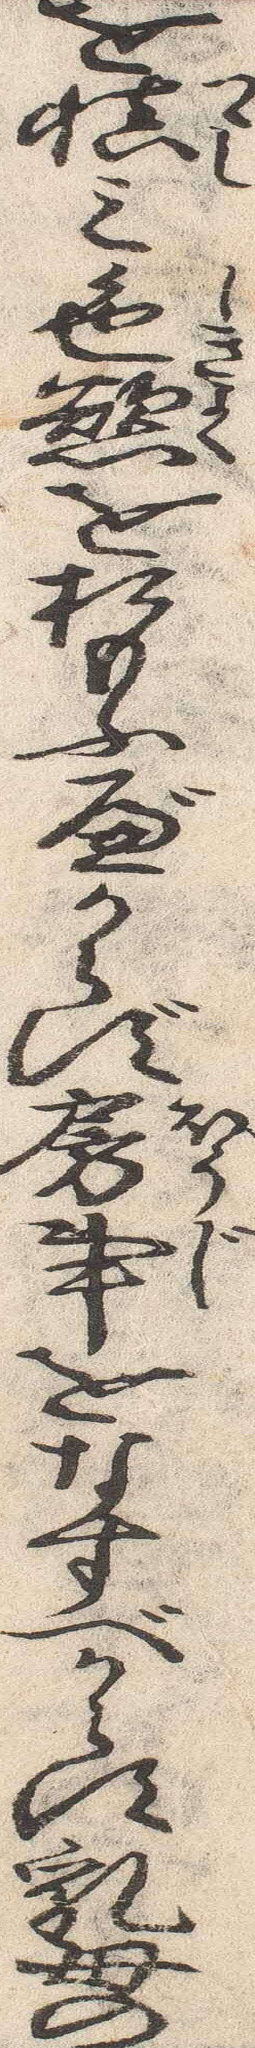を慎み色慾をおもふべからず房事をなすべからす乳母の
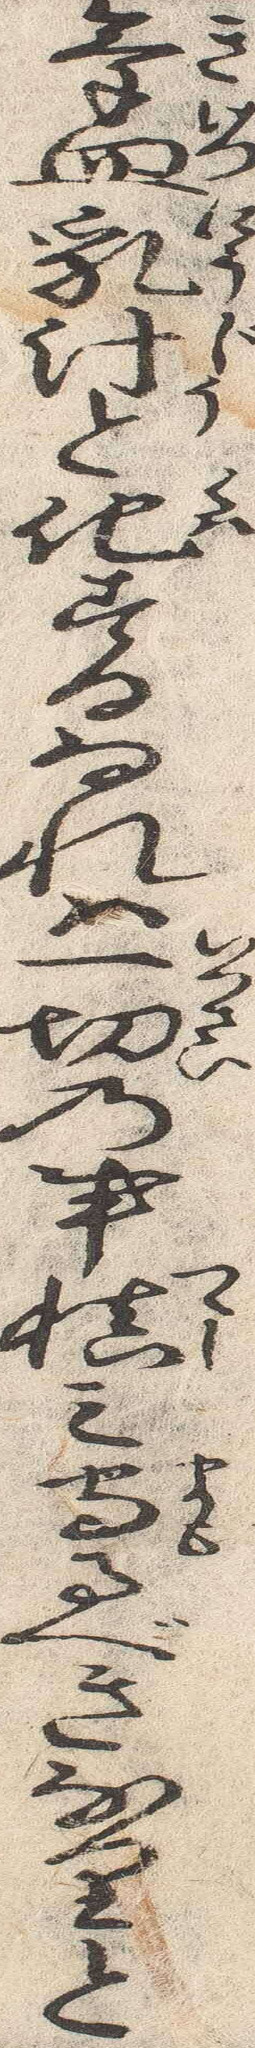気血乳汁と化するなれは一切の事慎み守るべきなりと
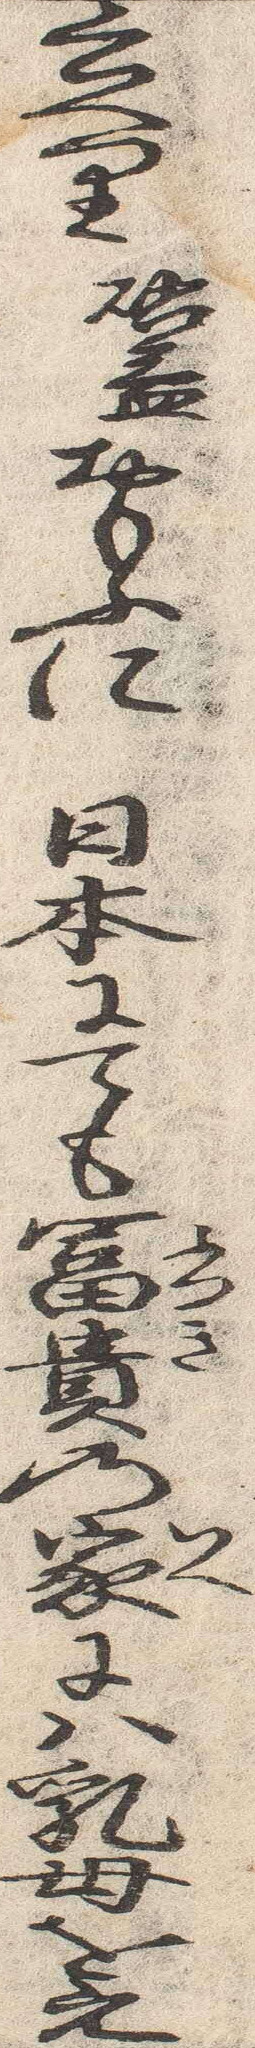云へり啓益おもふに日本にても冨貴の家には乳母をえ
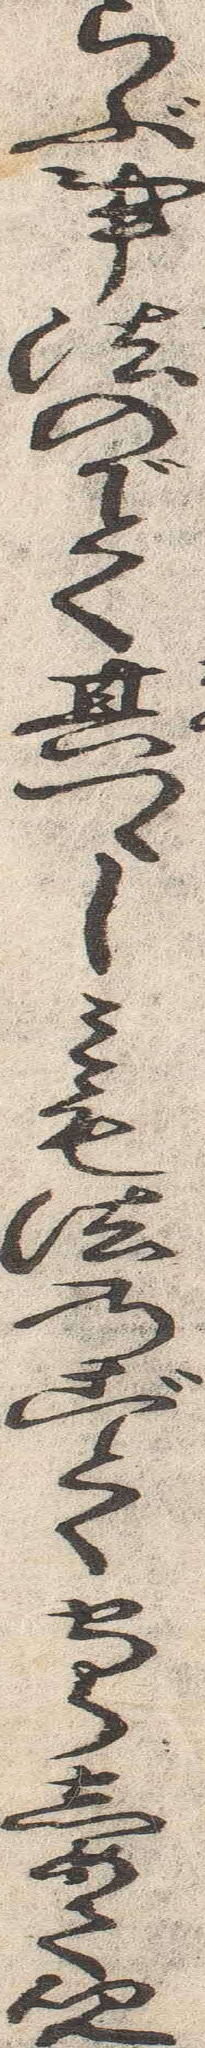らぶ事法のごとく其つゝしみも法のごとく守らしめて児
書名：小児必用養育草
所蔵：東京学芸大学附属図書館 国文学研究資料館
